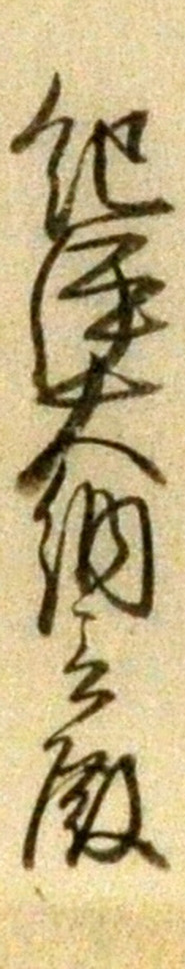紀伊大納言殿
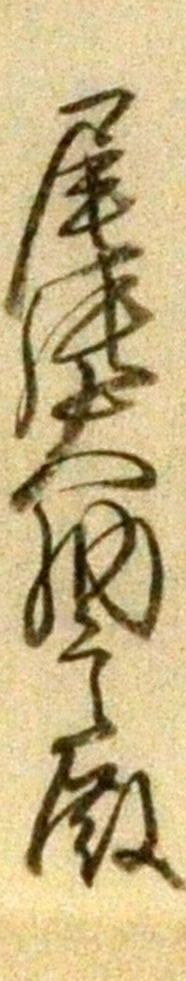尾張大納言殿
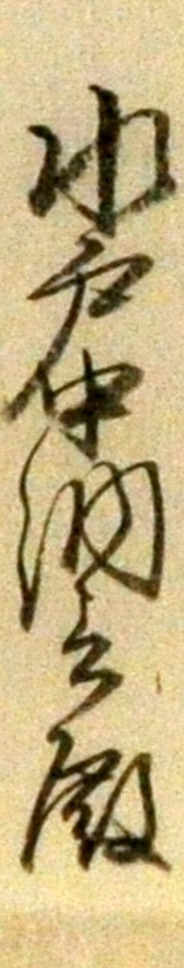水戸中納言殿
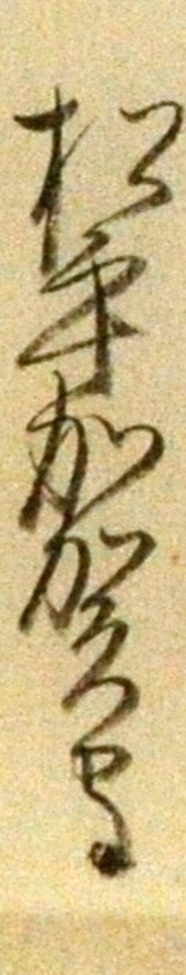松平加賀守
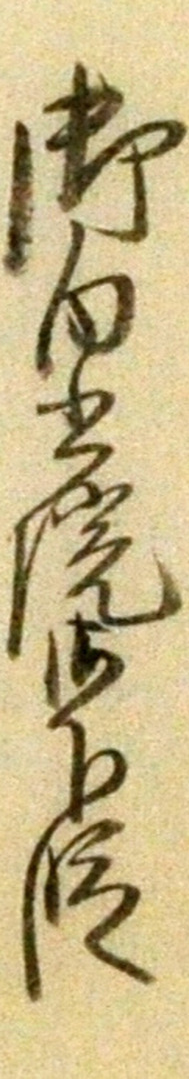御白書院御下段
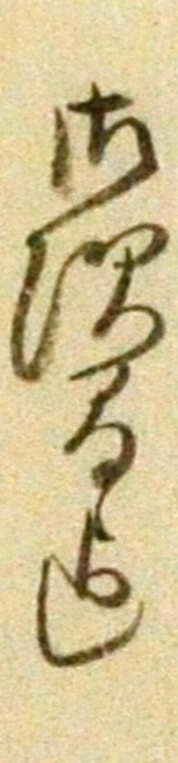御次間迄
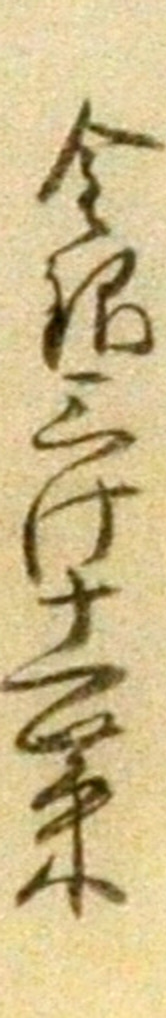金銀三汁十一菜
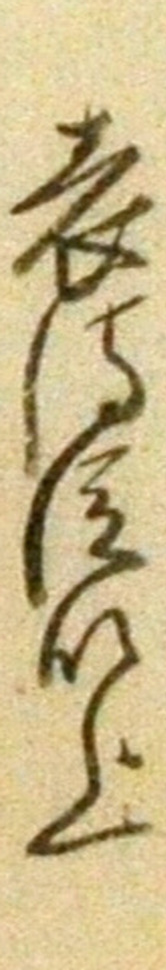表侍従以上
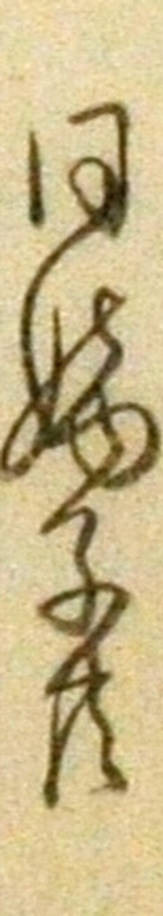同嫡子共

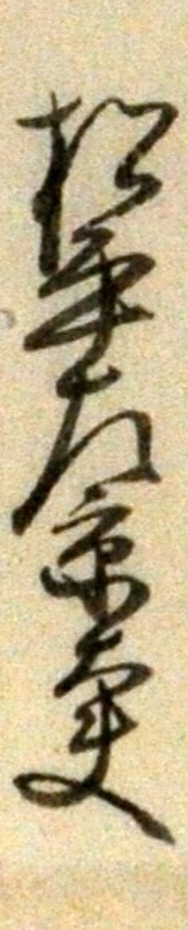松平左近大夫
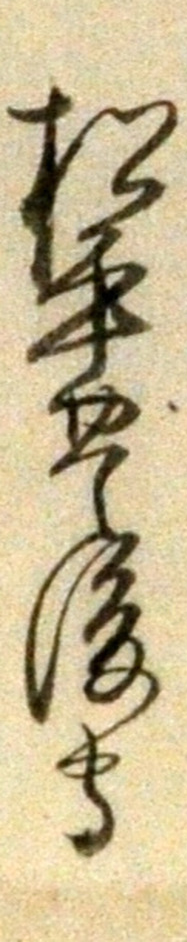松平豊後守
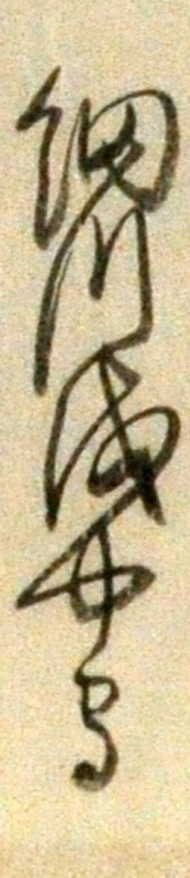細川越中守
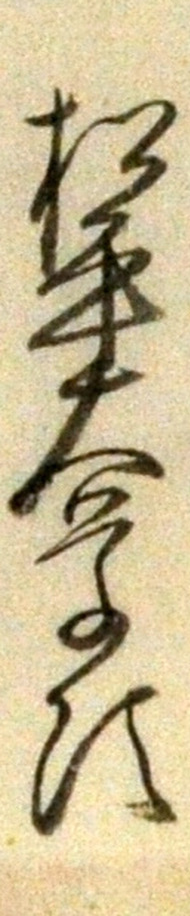松平大学頭
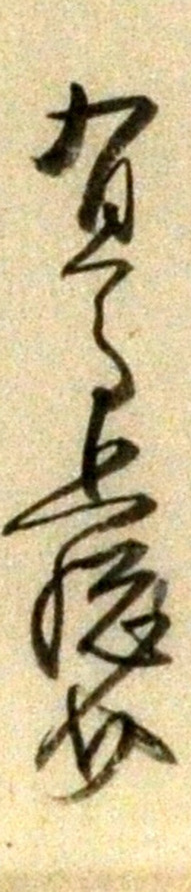有馬上総介
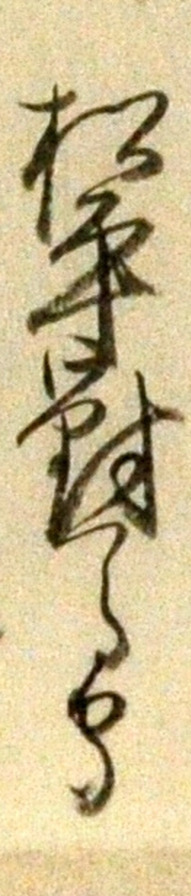松平対馬守
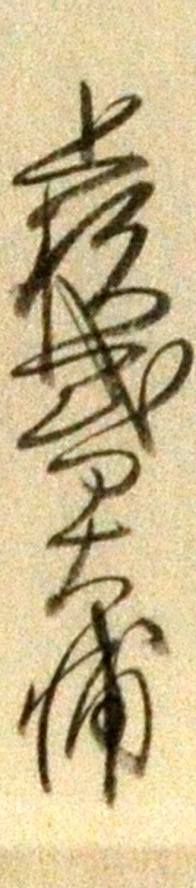上杉式部大輔
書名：御馳走御能ノ節ノ留外
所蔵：伊那市立高遠町図書館・合同会社AMANE
